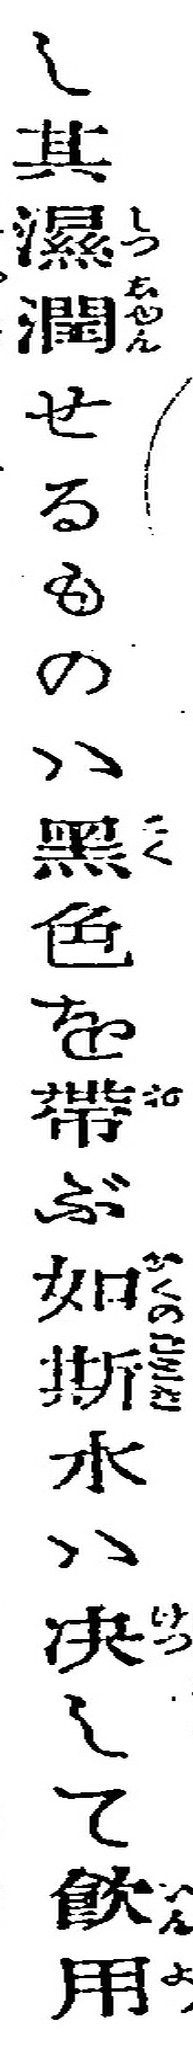し其濕潤せるものは黒色を帯ぶ如斯水は決して飲用
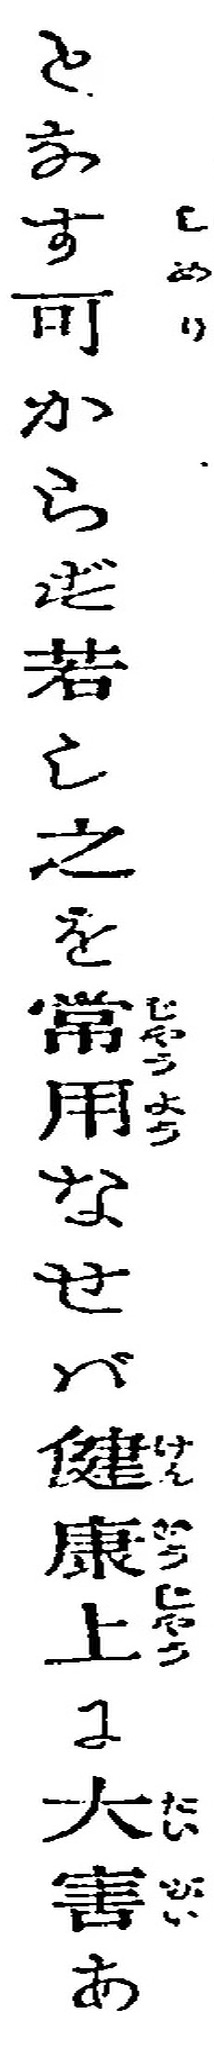となす可からず若し之を常用なせば健康上に大害あ
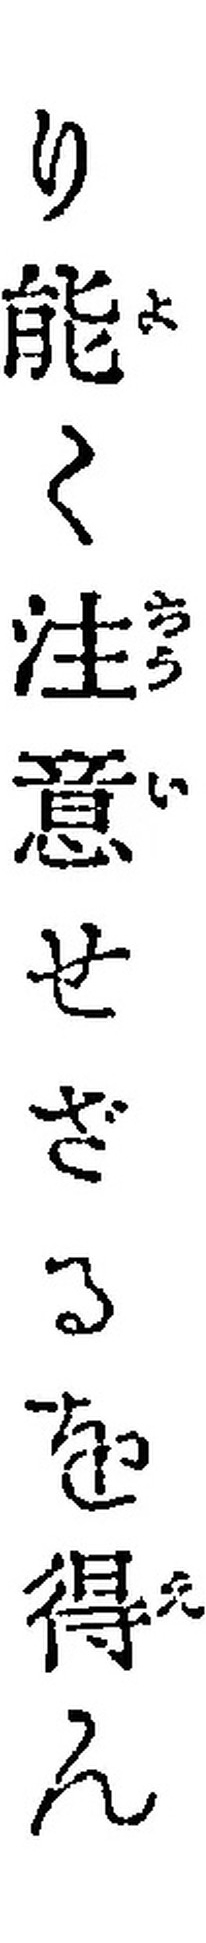り能く注意せざるを得ん
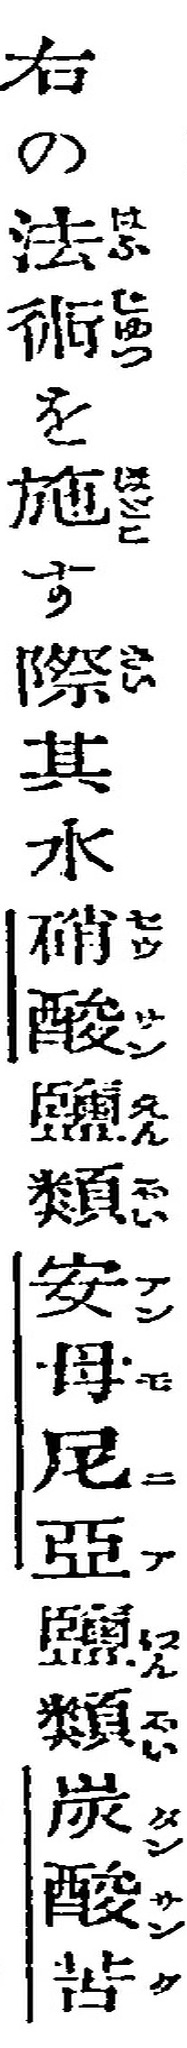右の法術を施す際其水硝酸鹽類安母尼亞鹽類炭酸苦
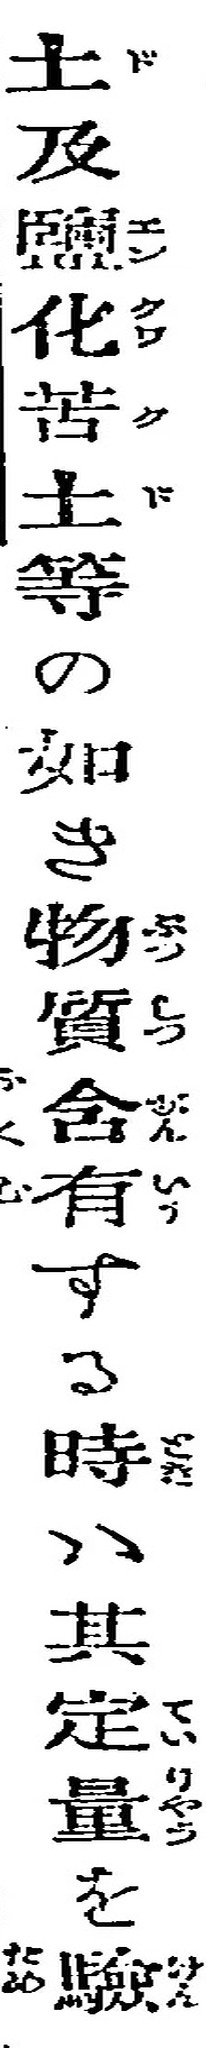土及鹽化苦土等の如き物質含有する時は其定量を験
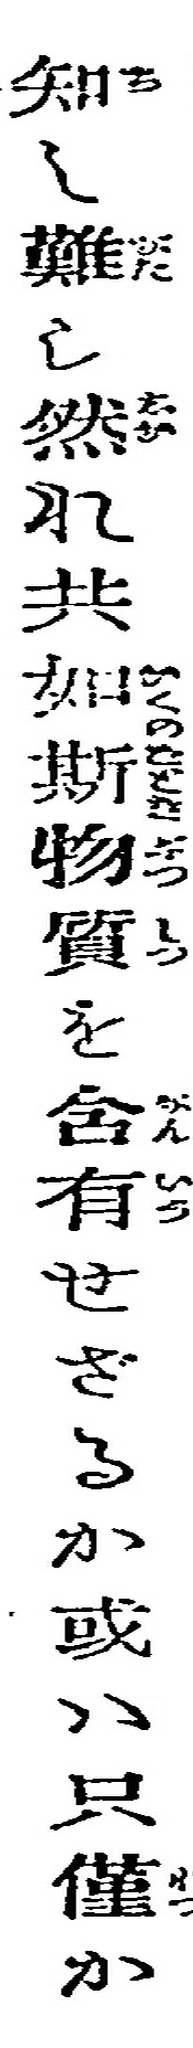知し難し然れ共如斯物質を含有せざるか或は只僅か
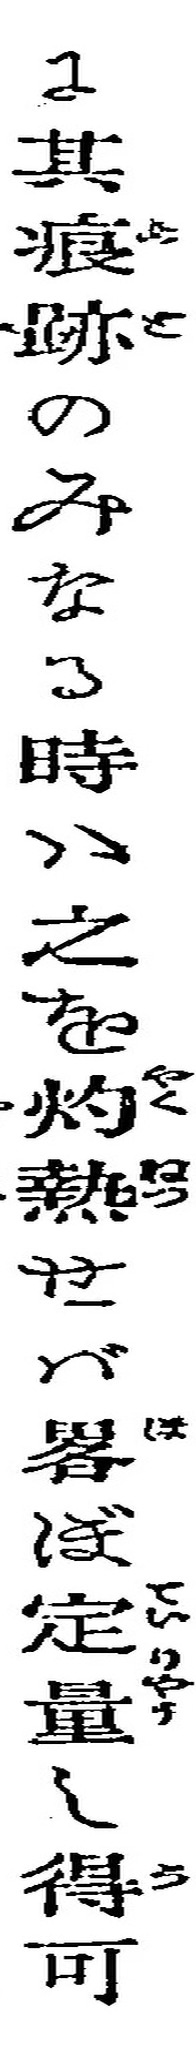に其痕跡のみなる時は之を灼熱畧ぼ定量し得可
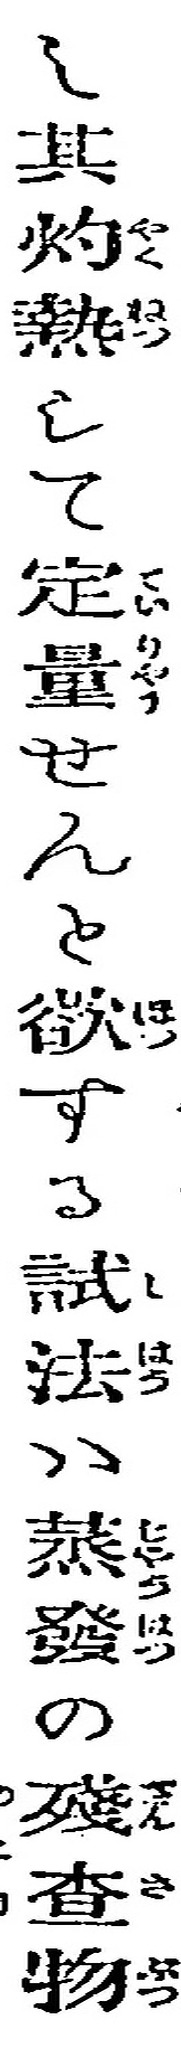し其灼熱して定量せんと欲する試法は蒸發の残査物
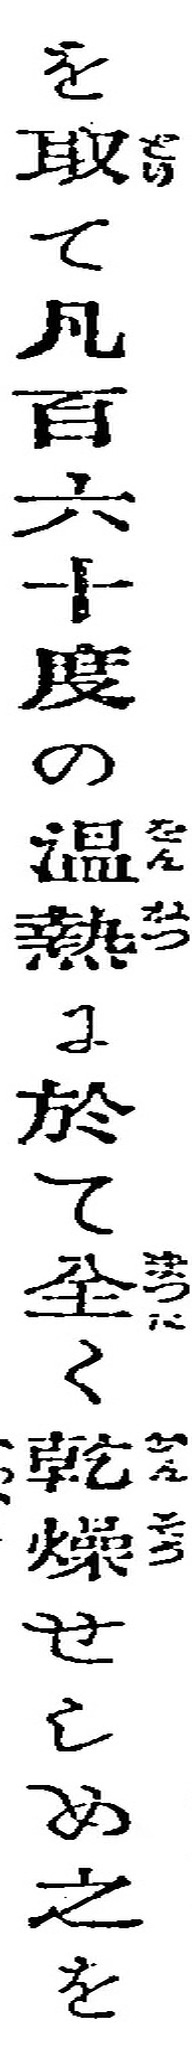を取て凡百六十度の温熱に於て全く乾燥せしめ之を
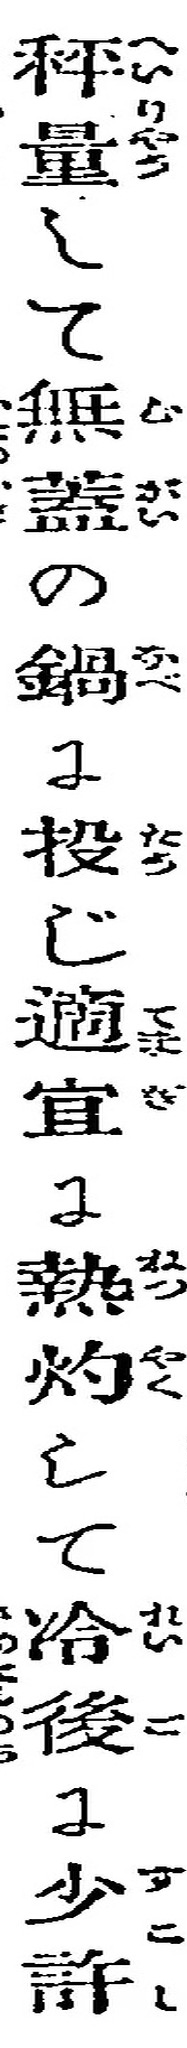秤量して無蓋の鍋に投じ適宜に熱灼して冷後に少許
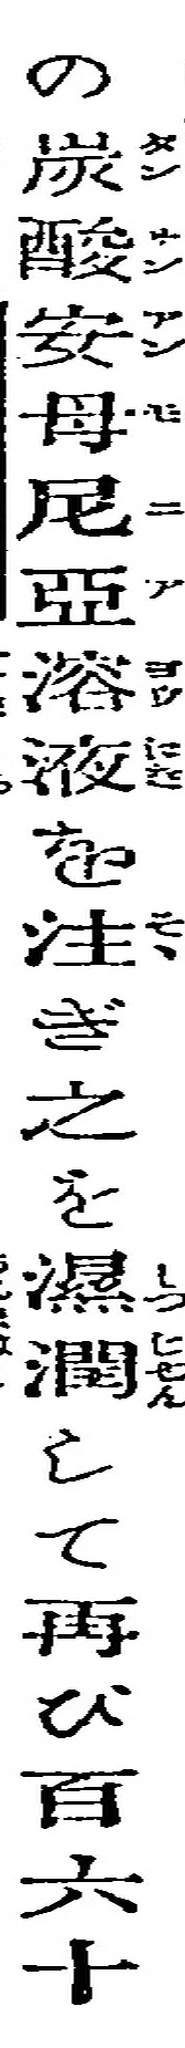の炭酸安母尼亞溶液を注ぎ之を濕潤して再び百六十
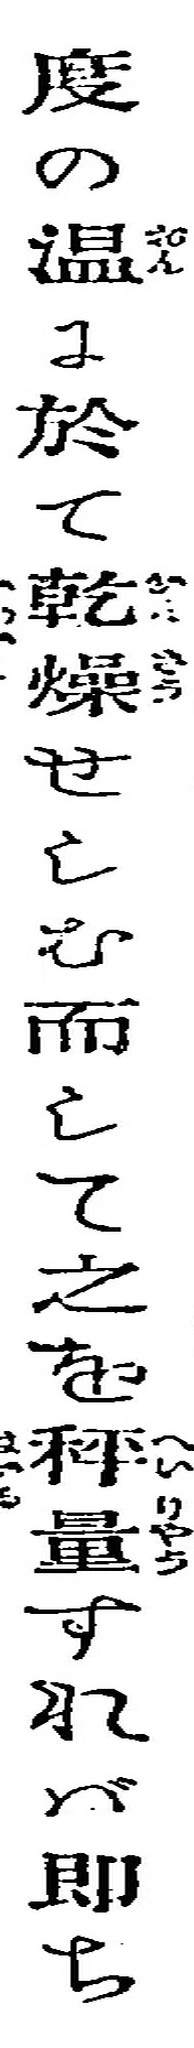度の温に於て乾燥せしむ而して之を秤量すれば即ち
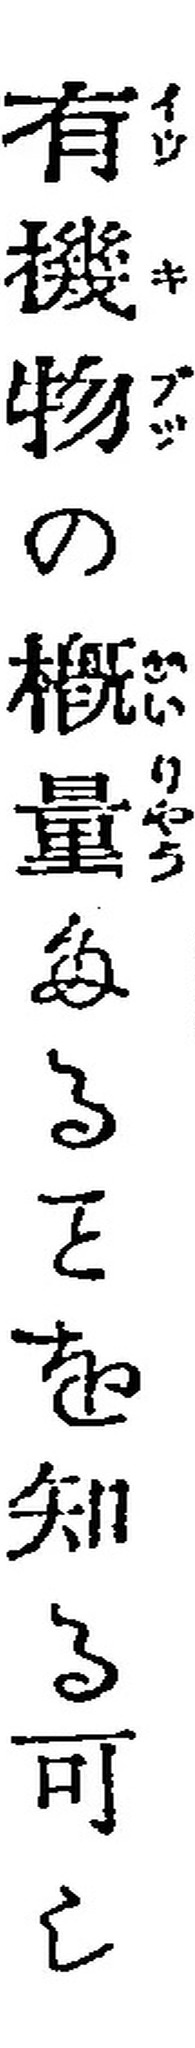有機物の概量たることを知る可し
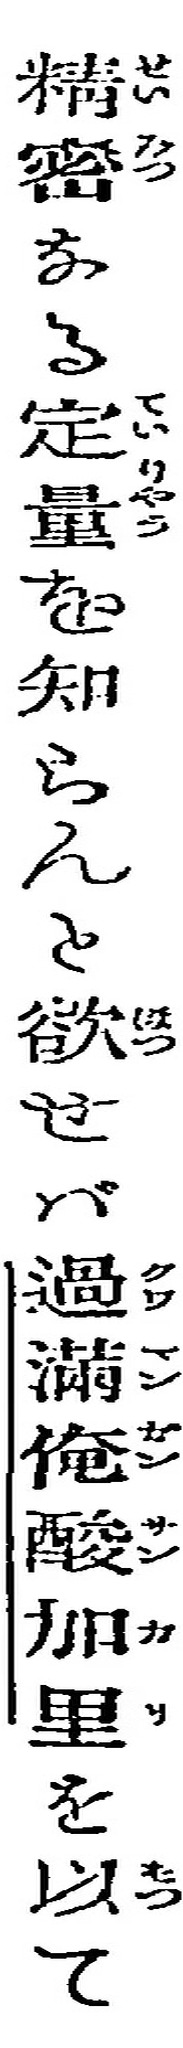精密なる定量を知らんと欲せば過滿俺酸加里を以て
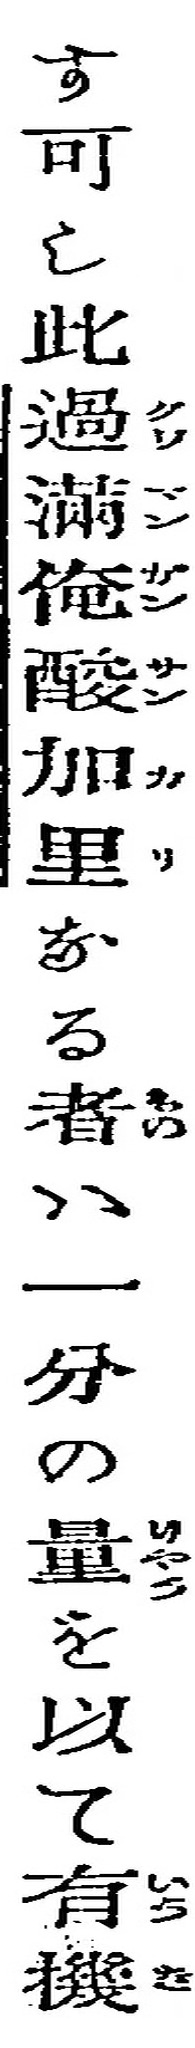す可し此過滿俺酸加里なる者は一分の量を以て有機
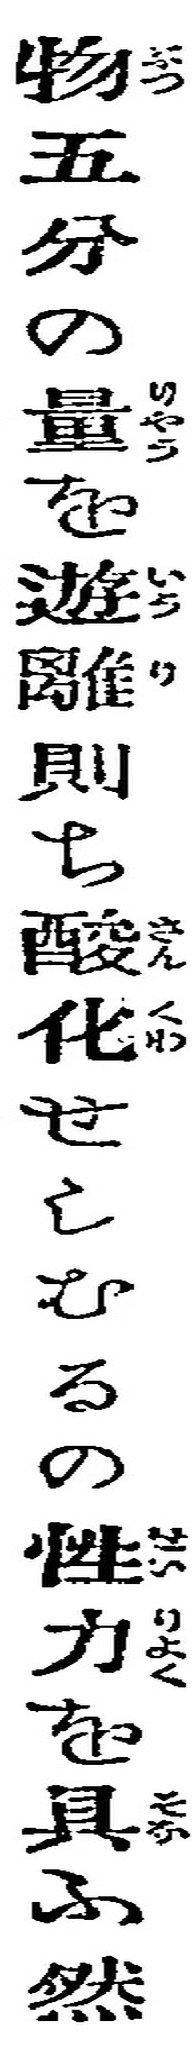物五分の量を遊離則ち酸化せしむるの性力を具ふ然
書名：飲水の心得 : 伝染病の予防
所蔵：国立国会図書館 National Diet Library, JAPAN
